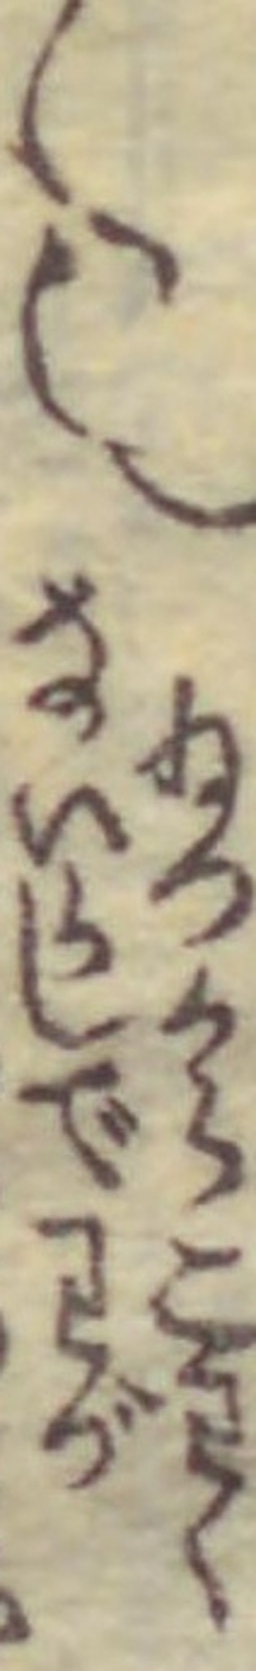ないかしでわが
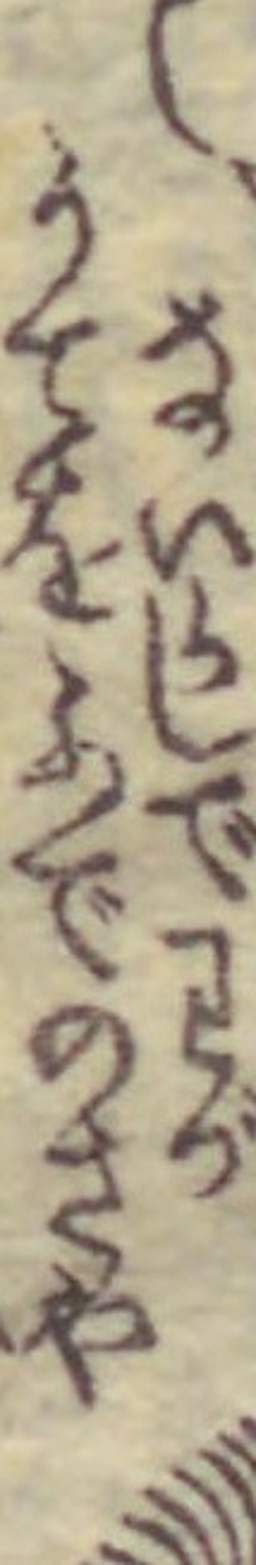うてをふでのさや
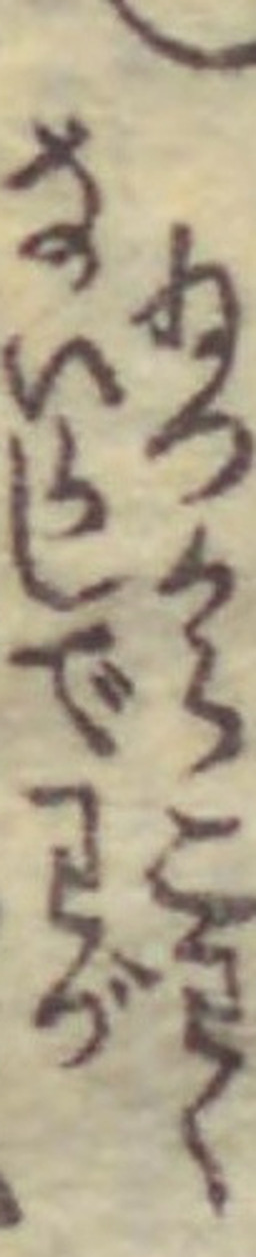ないかしでわが
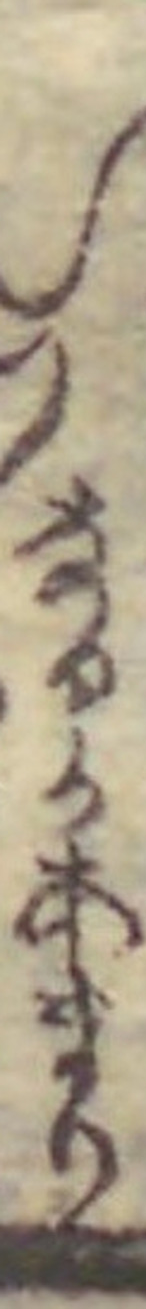なるかあまり
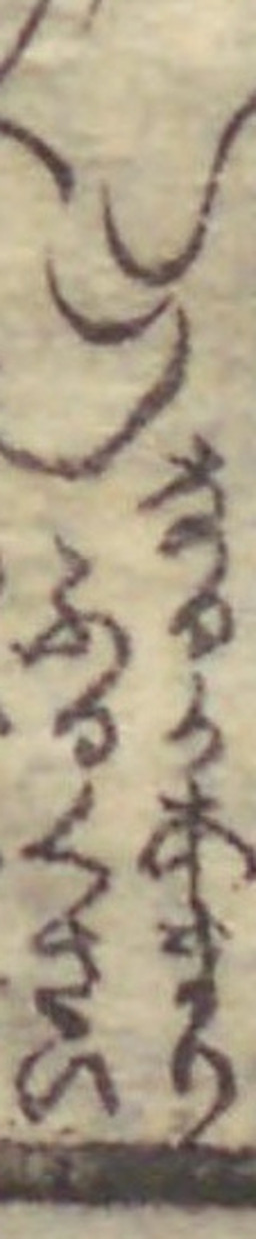ふるくさい
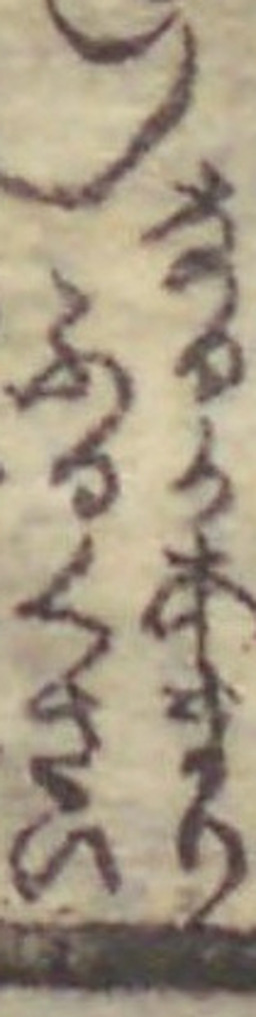ふるくさい
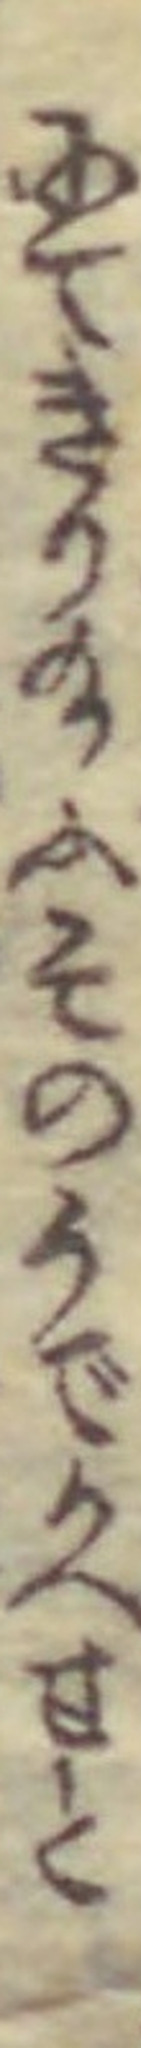にてきり給ふそのうでかへせと
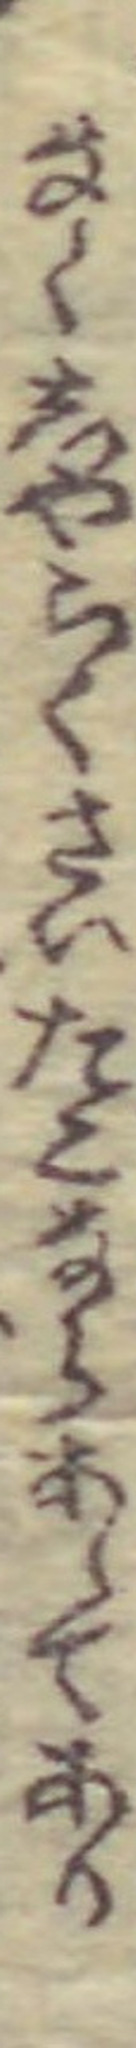なくしやらくさいたこならあしてあり
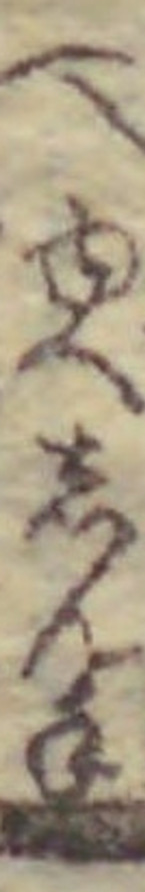ゆへしんて
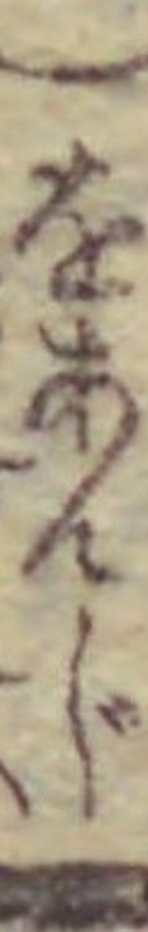をあんじ
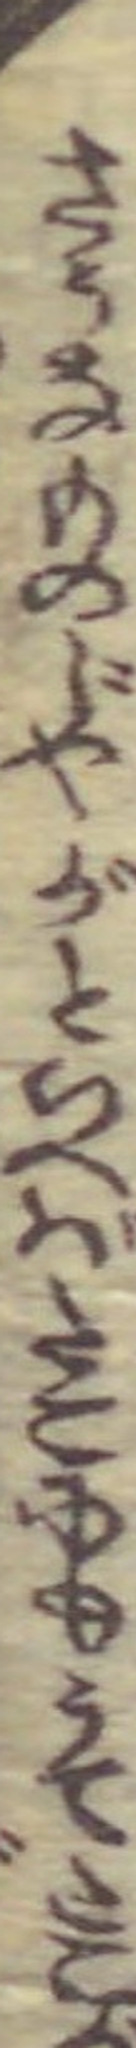さうなものじやがといへばたこにもうてたこが
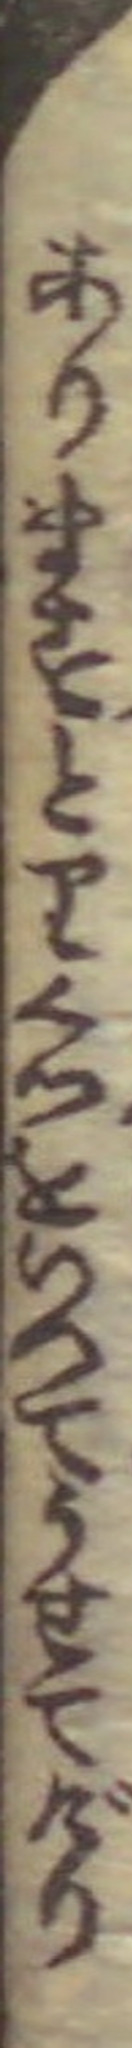ありますとりくつをいつてうせてげり
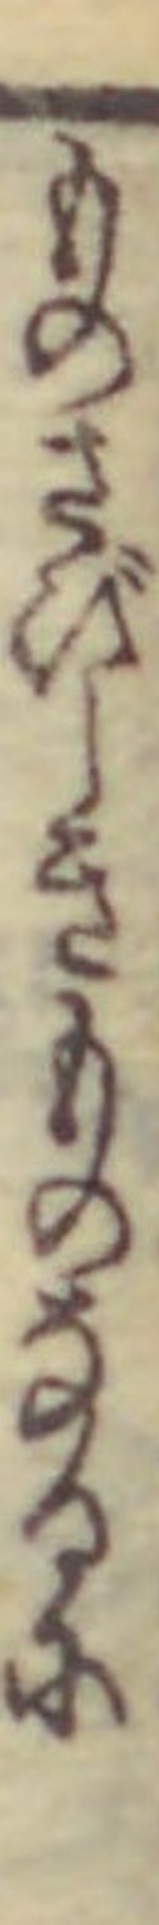ものさびしきものなるに
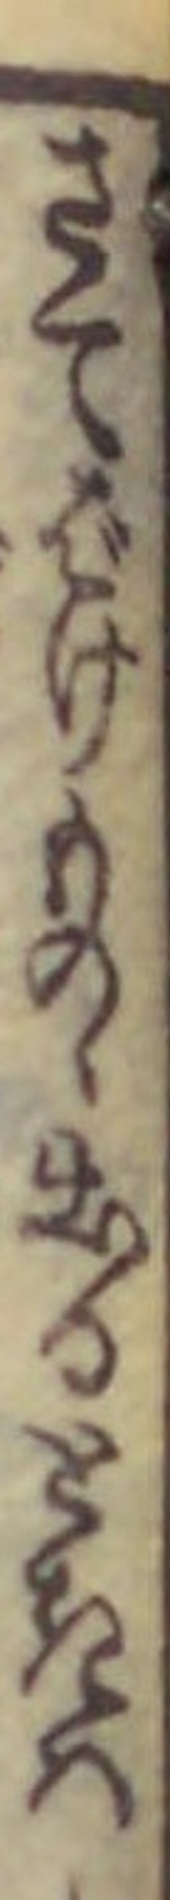さてばけものゝでるときは
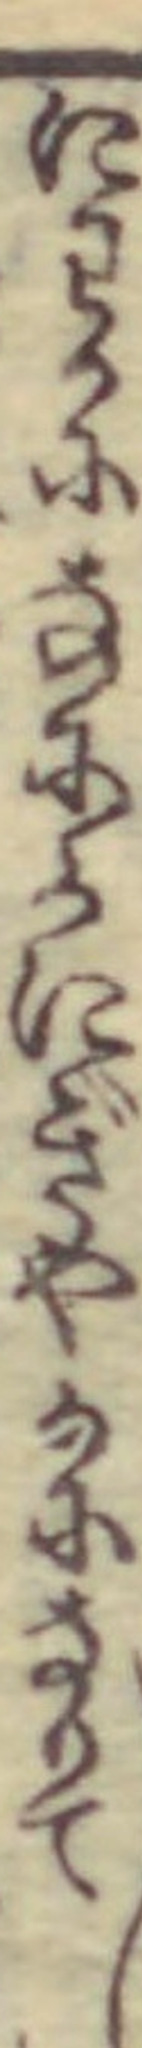にわかになにかにぎやかになりて
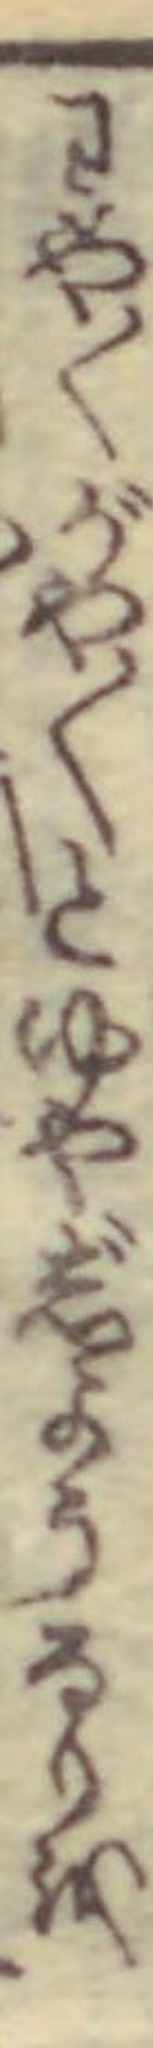わや〳〵がや〳〵とゆやじようるりを
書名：大時代唐土化物 3巻. 曽我太夫染
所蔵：国立国会図書館 National Diet Library, JAPAN
